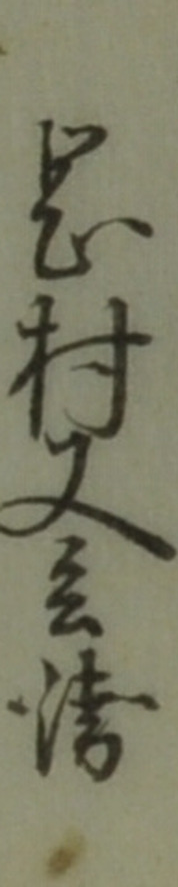岡村又兵衛
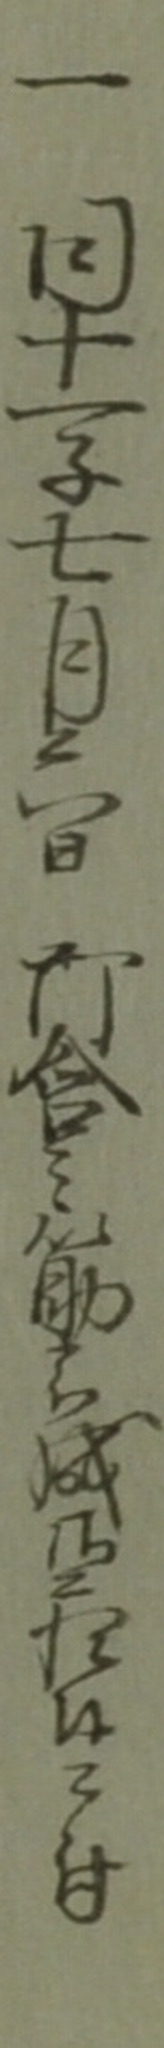一同十一子七月六日御含之筋被成御座候ニ付
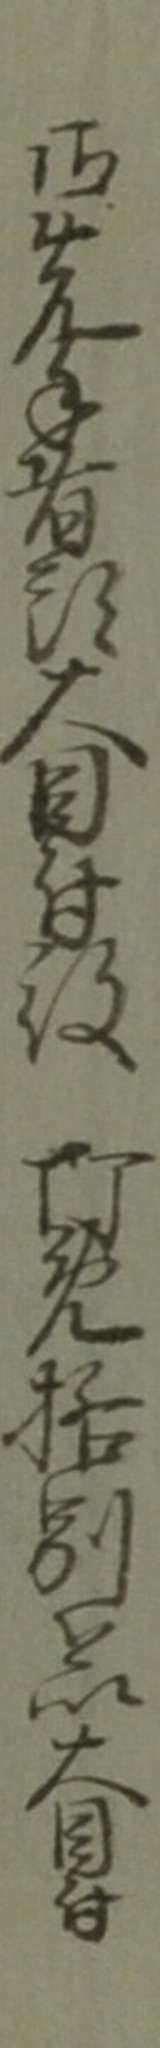御先手者頭大目付役御免格別を以大目付
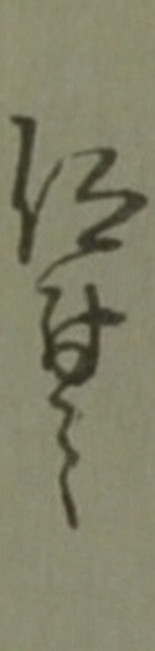仰付之
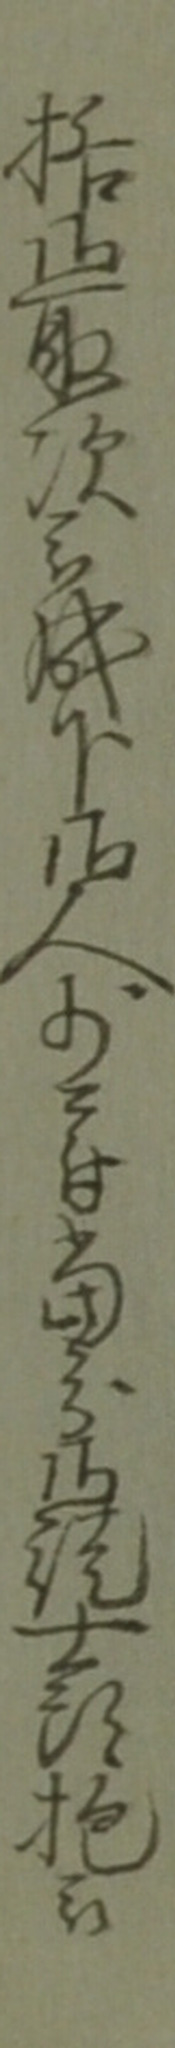格御取次被成下御人少ニ付当分御徒士頭抱被
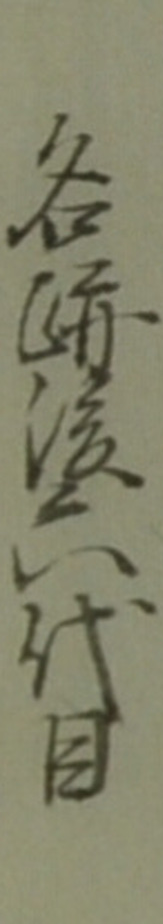名跡後六代目
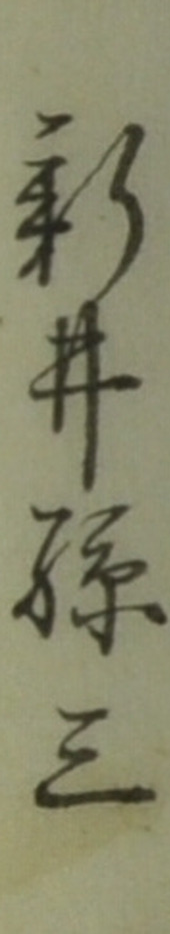新井孫三

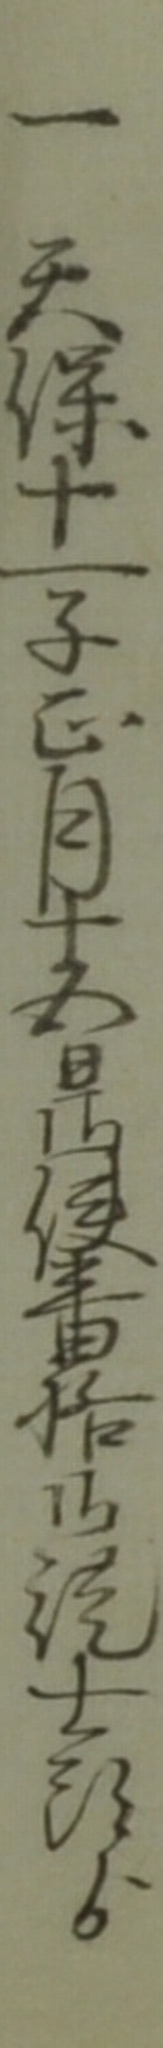一天保十一子正月十五日御使番格御徒士頭ゟ
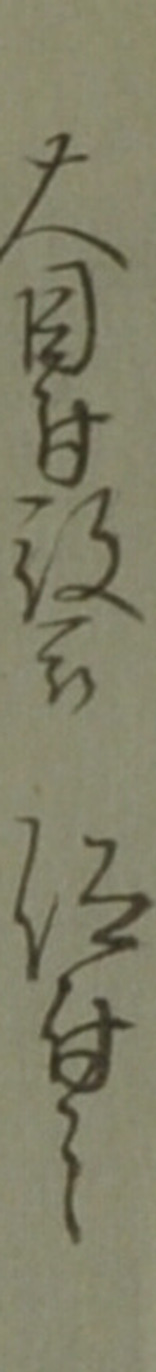大目付役被仰付之
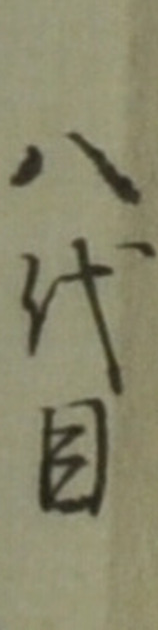八代目
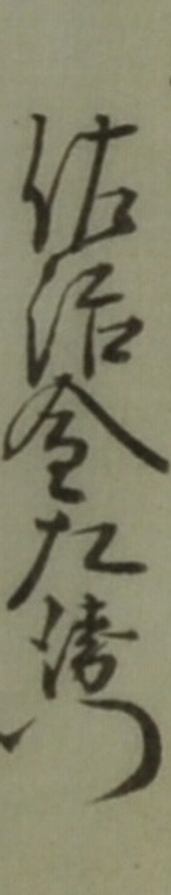佐治金左衛門
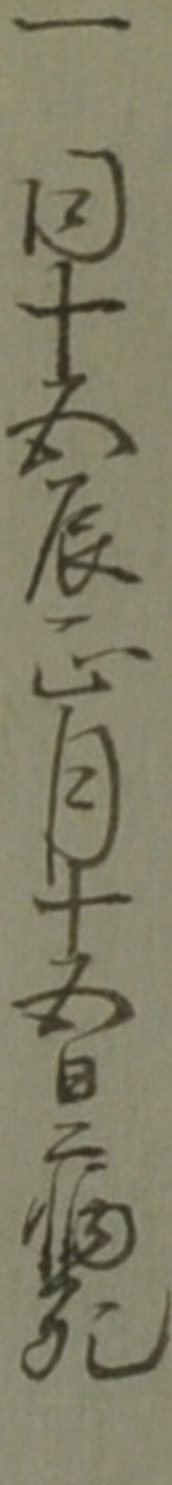一同十五辰正月十五日病死
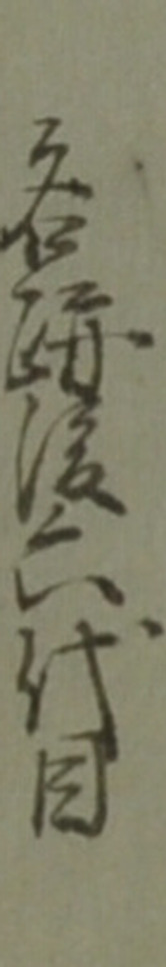名跡六代目
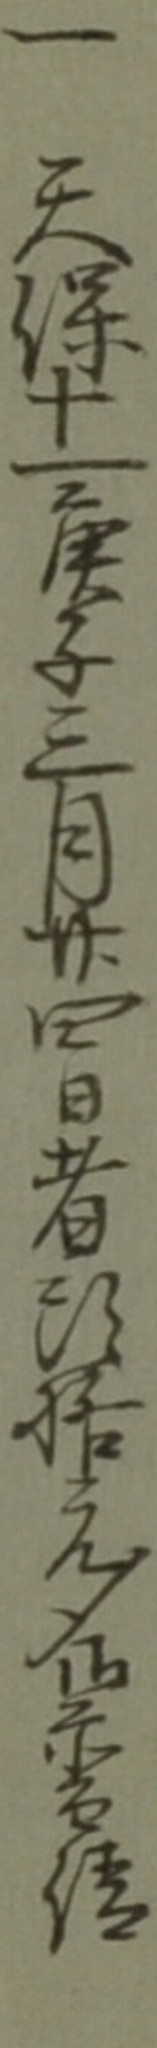一天保十一庚子三月廿四日者頭格元〆御普請
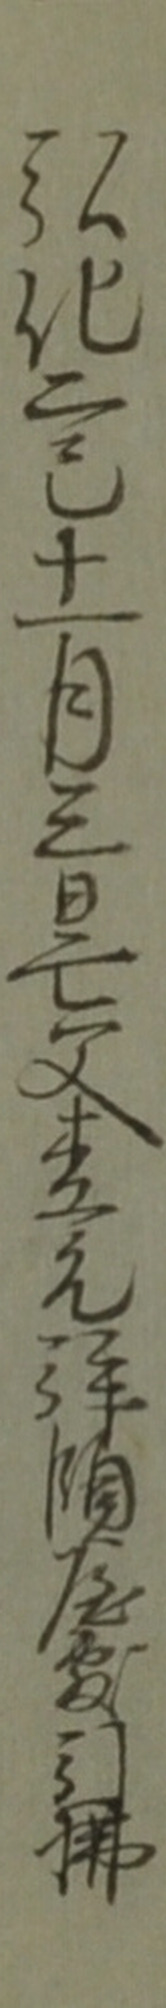一弘化二巳十一月三日亡父杢允拝領屋敷引払
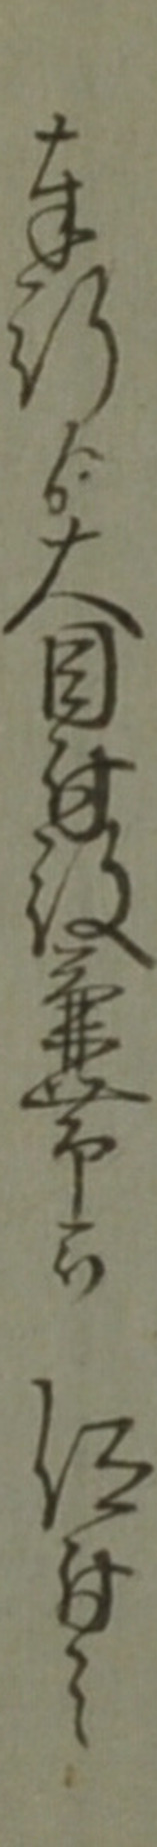奉行ゟ大目付役兼帯被仰付之
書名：諸御役代々録（三）
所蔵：伊那市立高遠町図書館・合同会社AMANE
